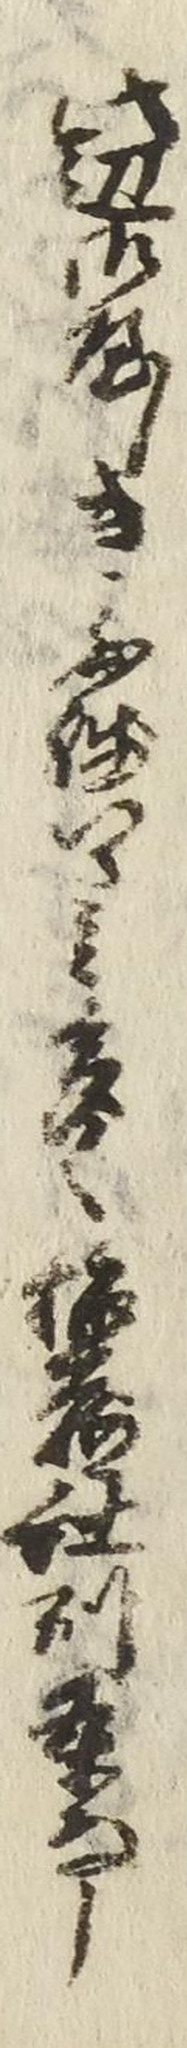此辺屋しき不残いたみ多し稲荷社別条なし
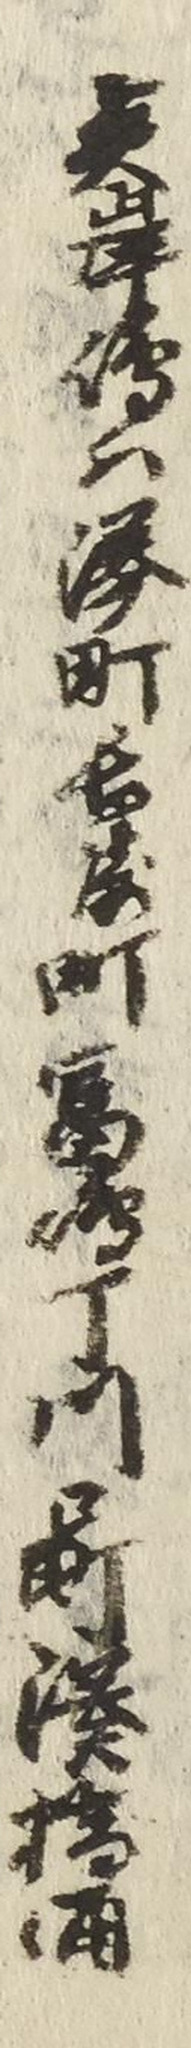霊岸嶋は湊丁長浜町富嶋丁川口町湊橋通
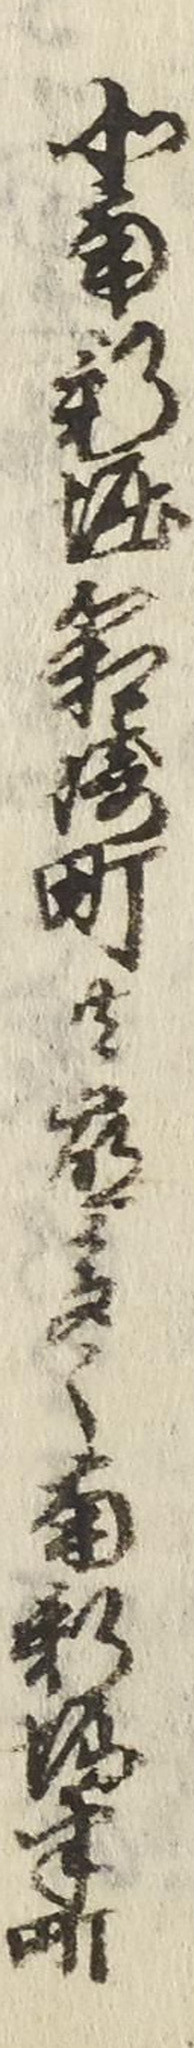北南新堀箱崎町共崩多く南新堀半町
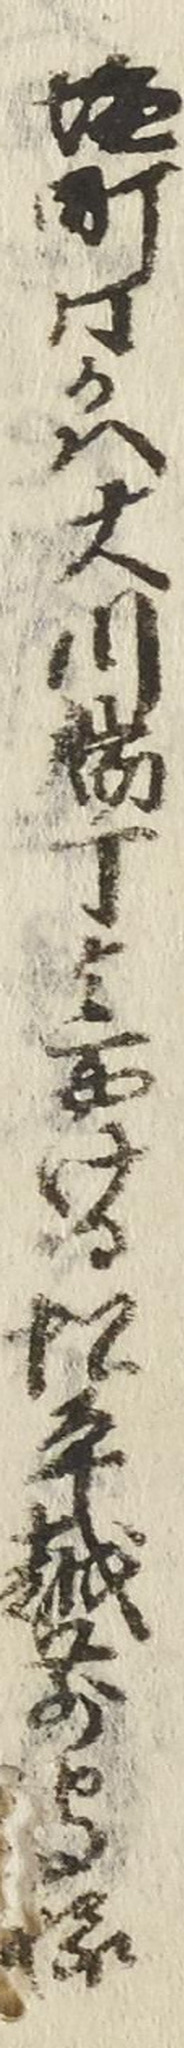塩町片かは大川端丁迄やける松平越前守様
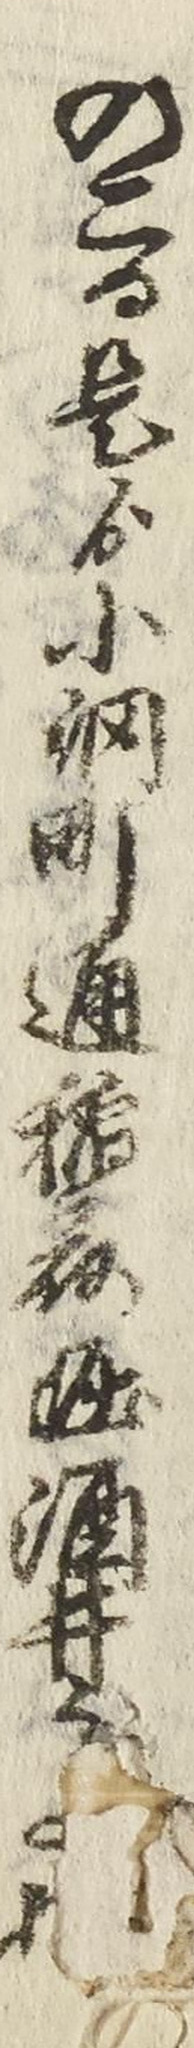のこる是ゟ小網丁通稲荷堀酒井うた様
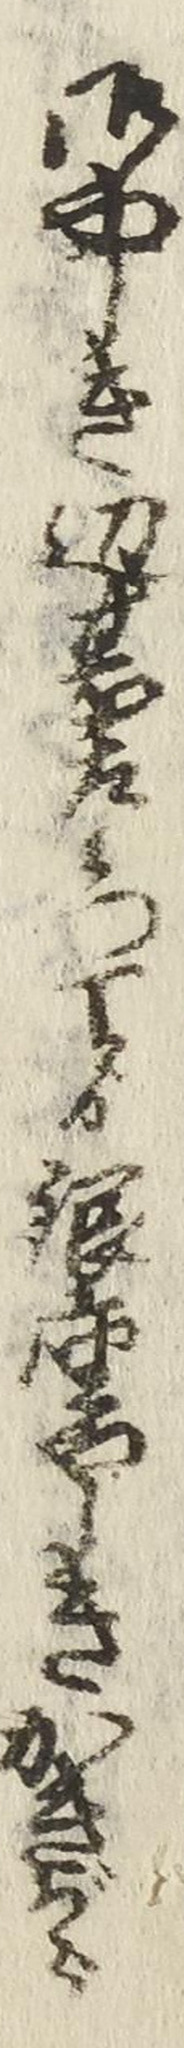御やしき辺甚左衛門丁ゟ銀座やしきかきうり
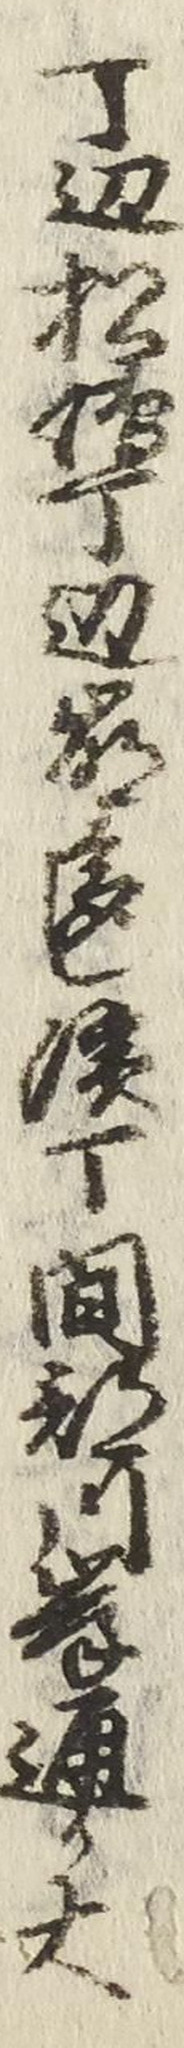丁辺松嶋丁辺崩多し湊丁間部川岸通り大
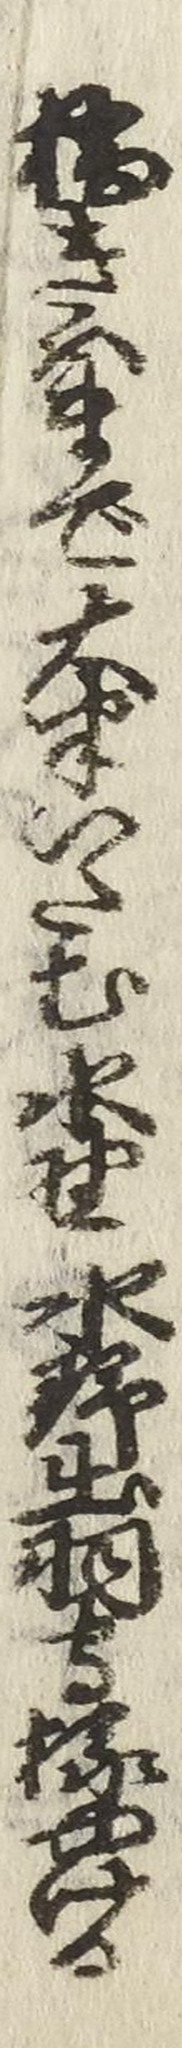橋きはまで大半いたむ水野水野出羽守様やける
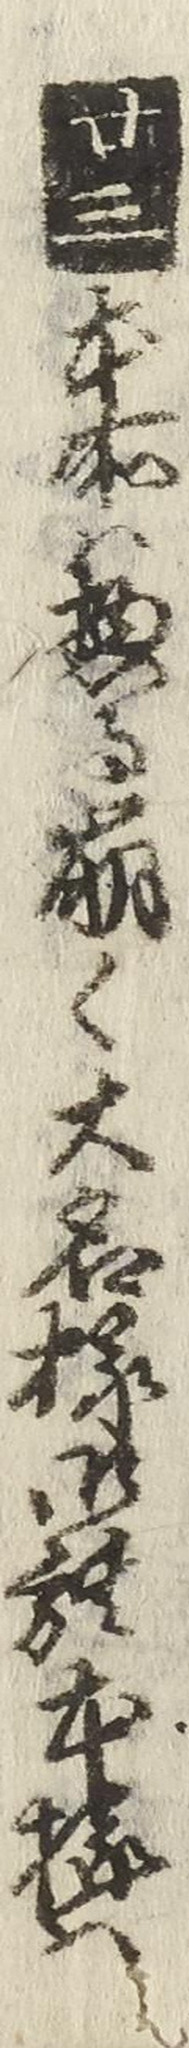廿三本所ハ惣而崩く大名様御旗本様
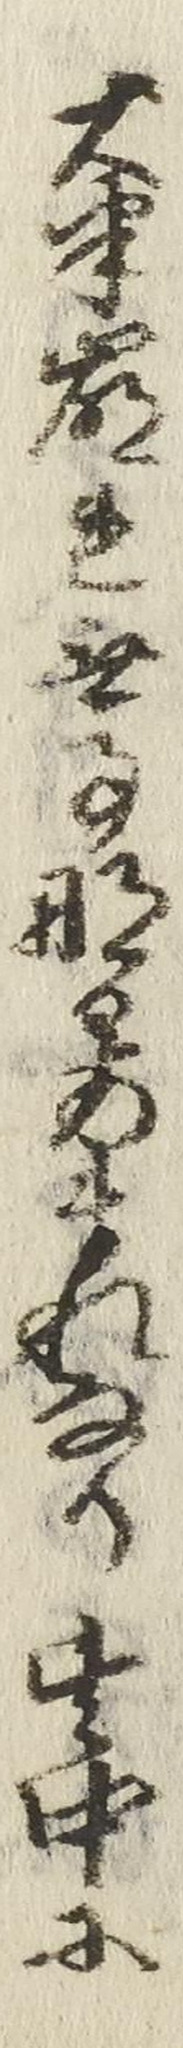大半崩れ無事なる方まれなり此中に
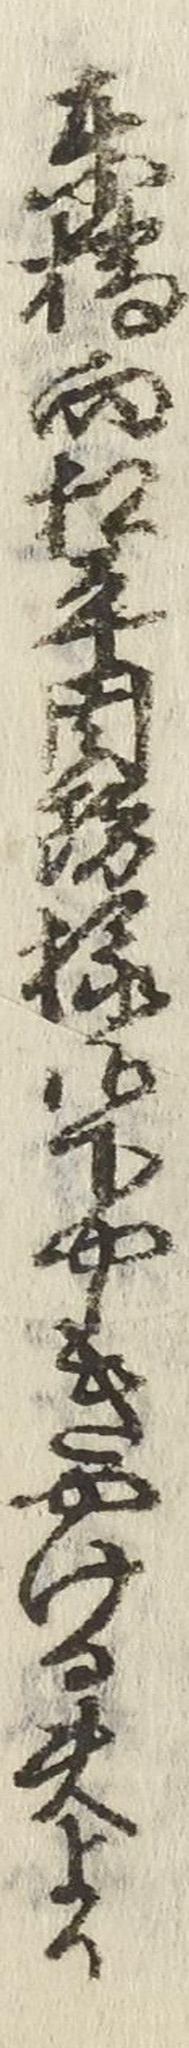本橋向松平周防様御下やしきやける夫より
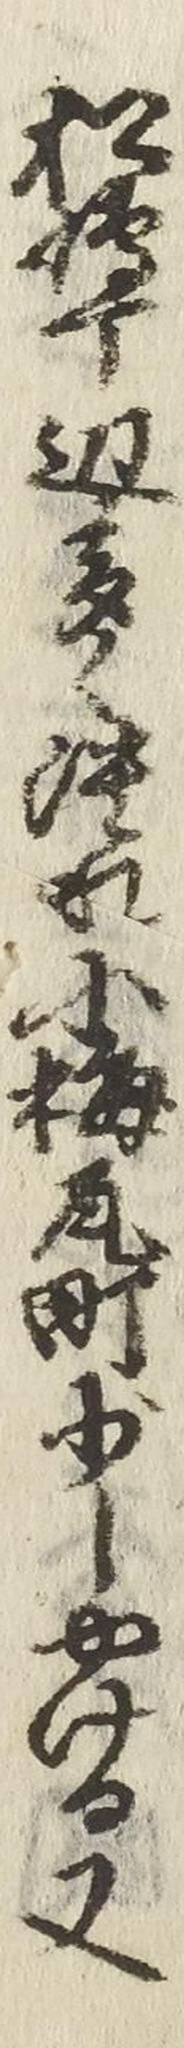松嶋丁辺多く潰れ小梅瓦町少しやける又
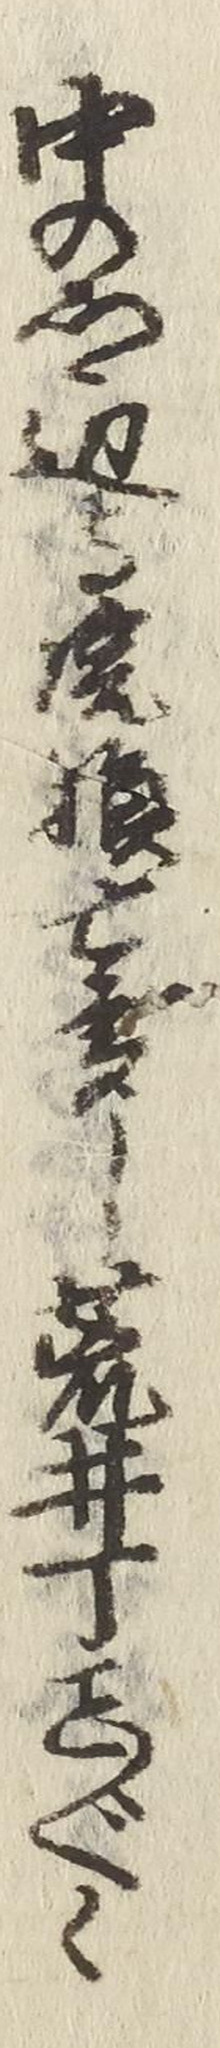中の郷辺寺院損亡多し荒井丁こと〴〵く
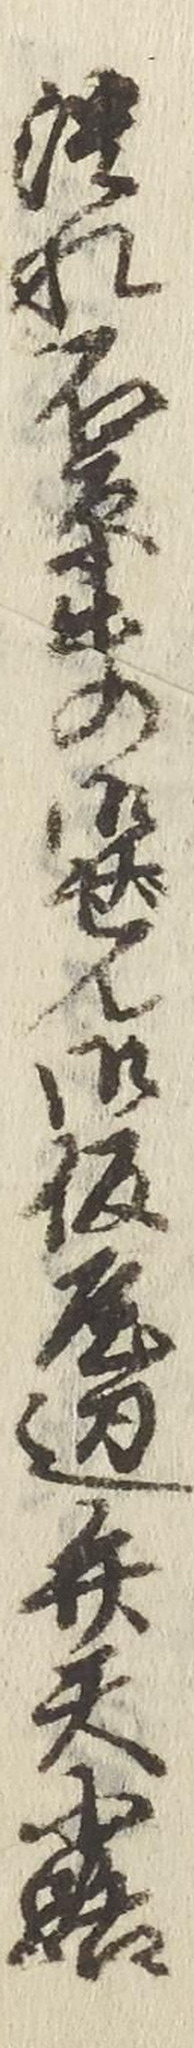潰れ石原牛の御ぜん御仮屋辺弁天小路
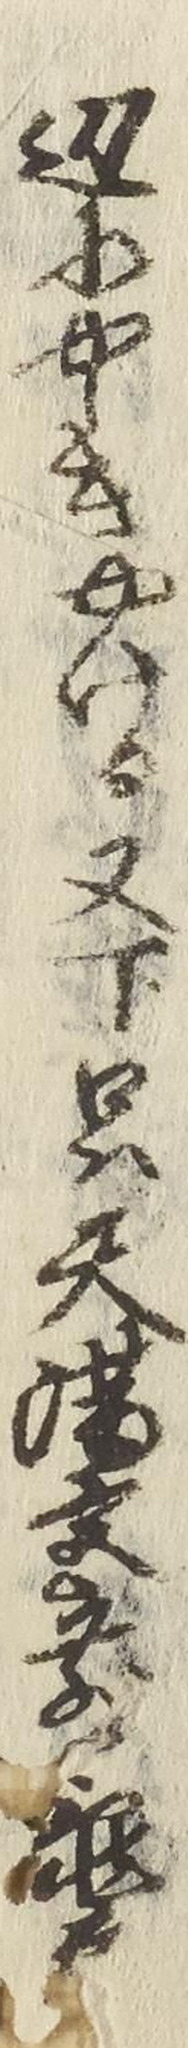辺小やしきやける又一ㇳ口は天満宮前亀戸
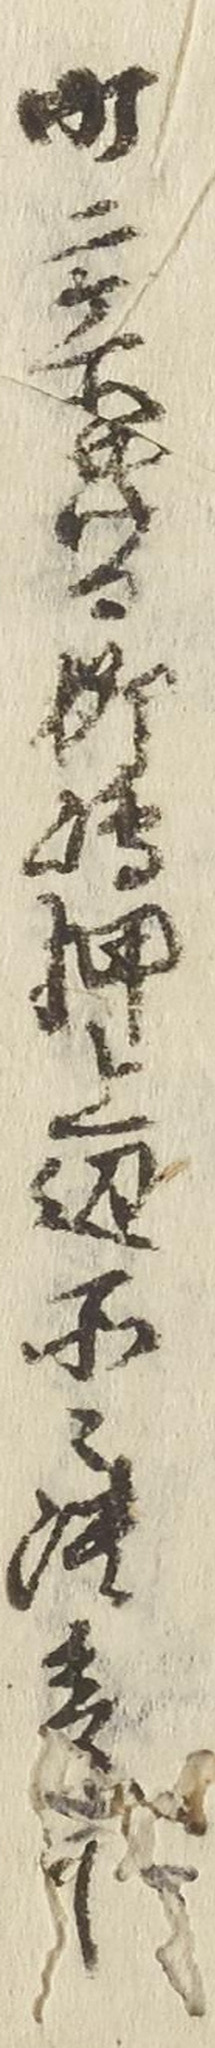町二ヶ所やける柳嶋押上辺所々潰多し
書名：地震出火　男女死人怪我人書上之寫
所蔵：東京大学地震研究所図書室 Earthquake Research Institute Library, The University of Tokyo, JAPAN
